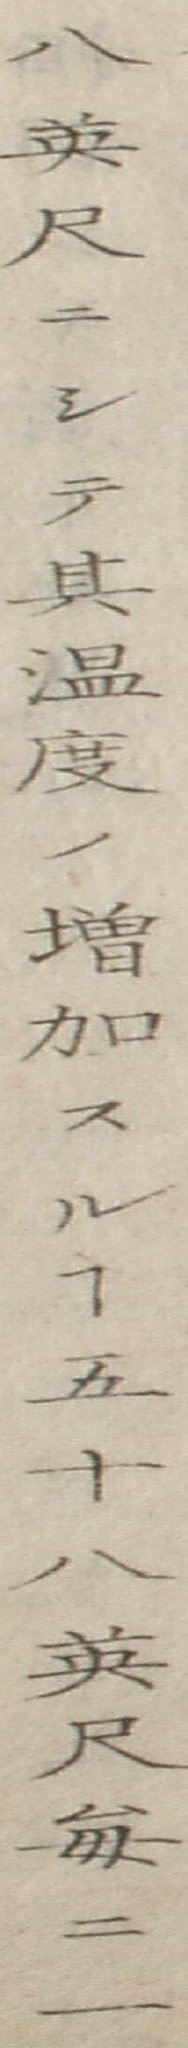八英尺ニシテ其温度ノ増加スルヿ五十八英尺毎ニ一
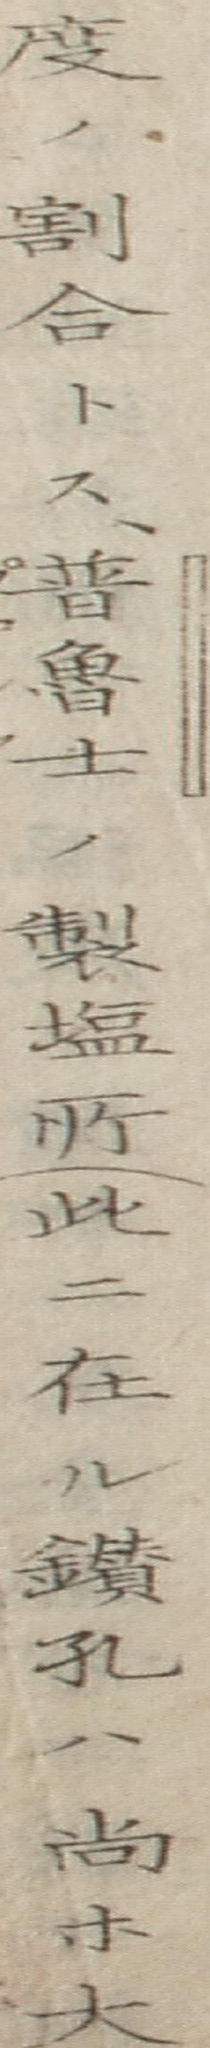度ノ割合トス、普魯士ノ製塩所（此ニ在ル鑚孔ハ尚ホ大
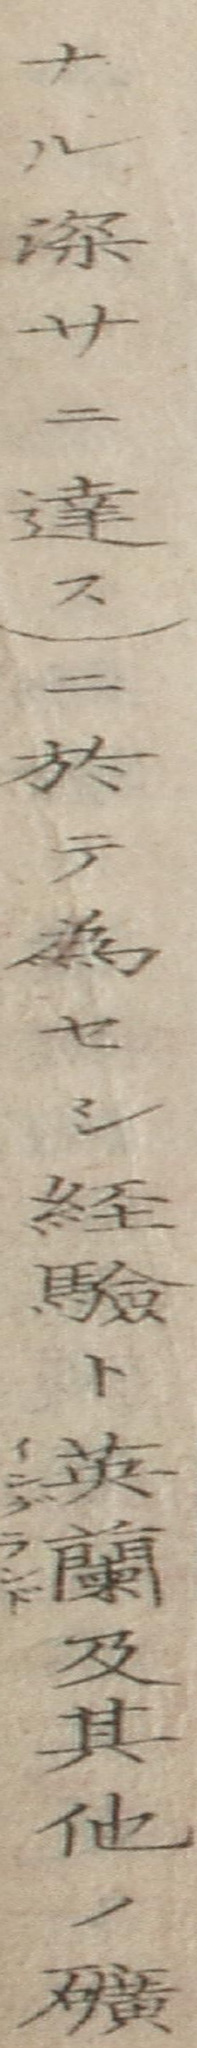ナル深サニ達ス）ニ於テ為セシ経験ト英蘭及其他ノ鉱

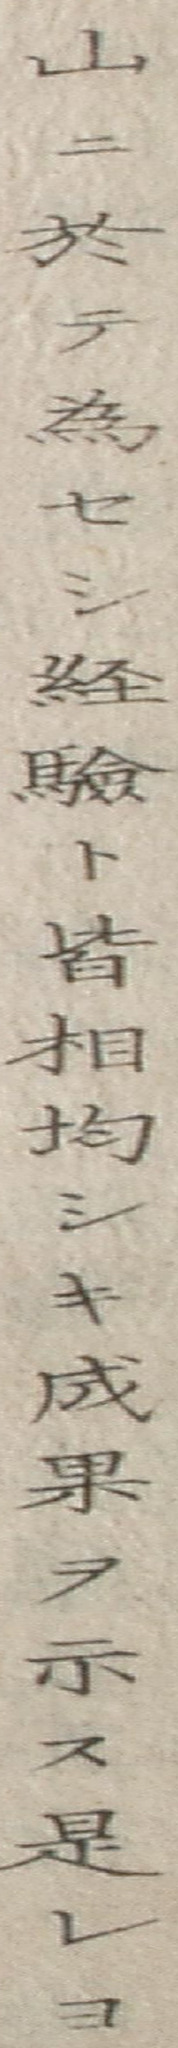山ニ於テ為セシ経験ト皆相均シキ成果ヲ示ス是レヨ
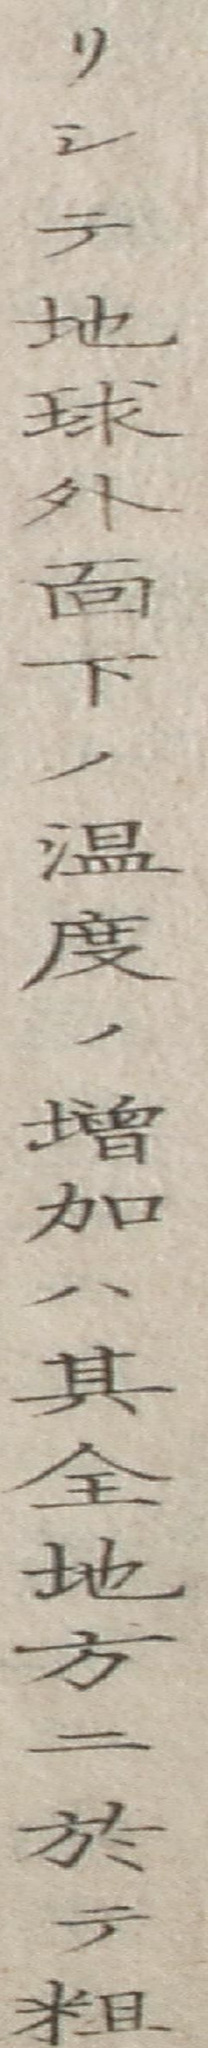リシテ地球外面下ノ温度ノ増加ハ其全地方ニ於テ粗
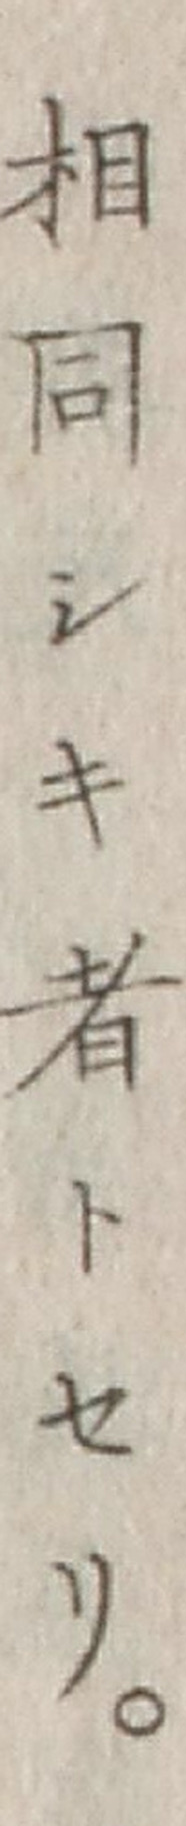相同シキ者トセリ。
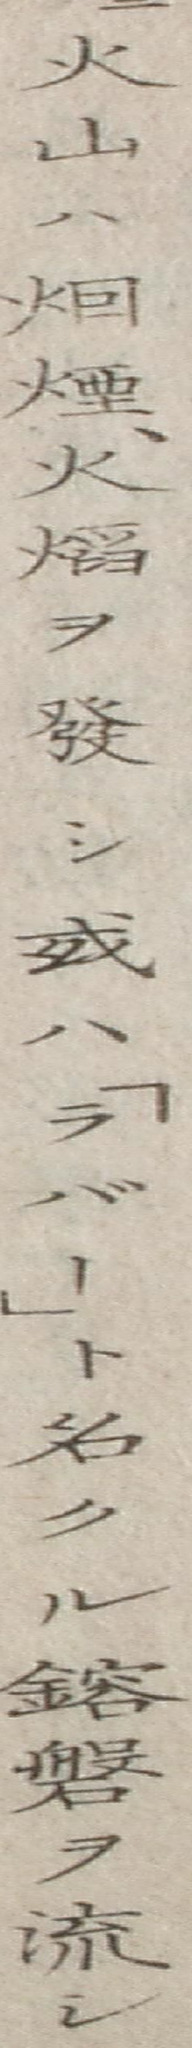二火山ハ𤇆煙、火焔ヲ発シ或ハ「ラバー」ト名クル鎔磐ヲ流シ
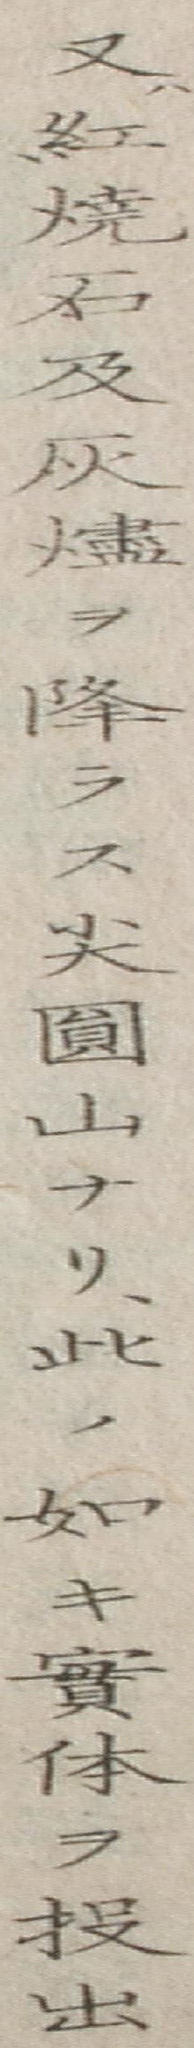又ハ紅焼石及灰燼ヲ降ラス尖円山ナリ、此ノ如キ実体ヲ投出
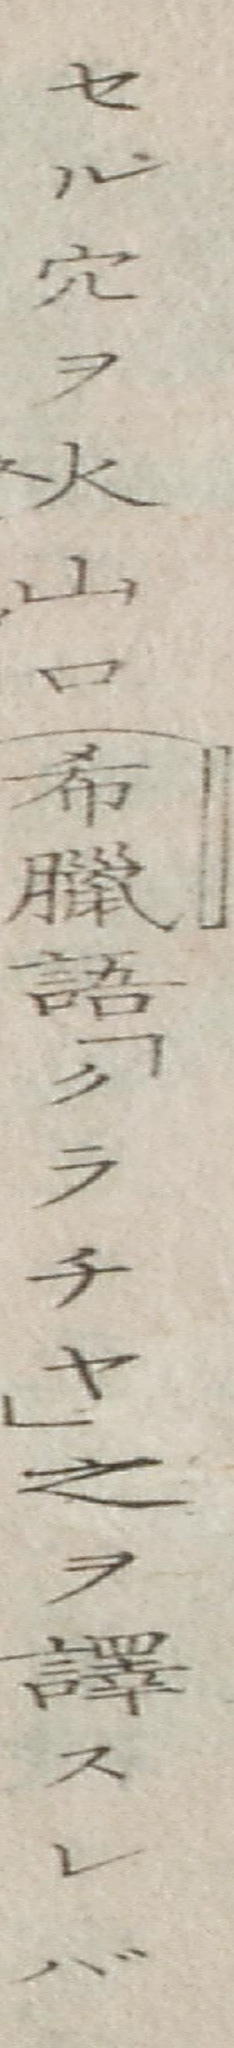セル穴ヲ火山口（希臘語「クラチヤ」之ヲ訳スレバ
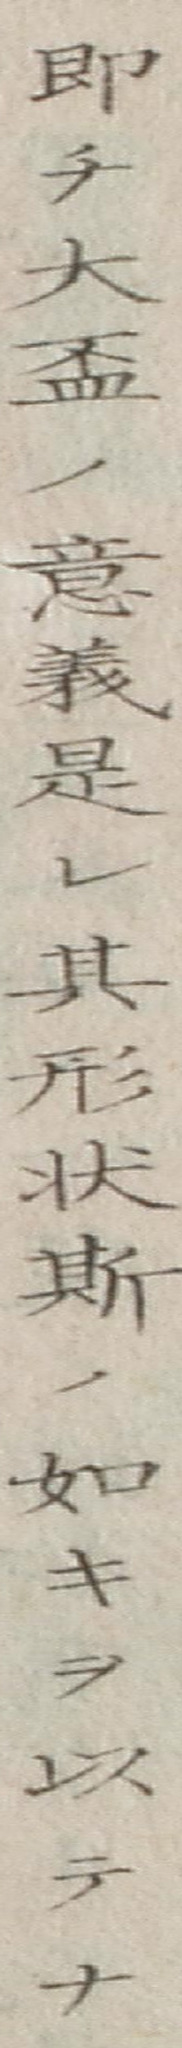即チ大盃ノ意義是レ其形状斯ノ如キヲ以テナ
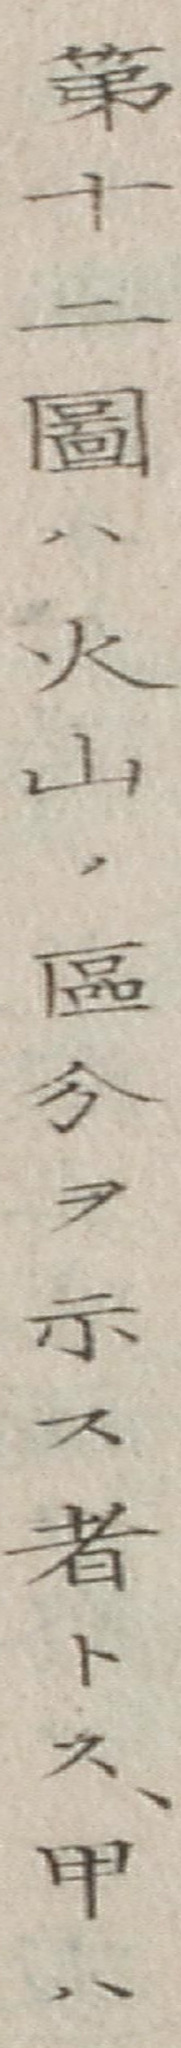第十二図ハ火山ノ区分ヲ示ス者トス、甲ハ
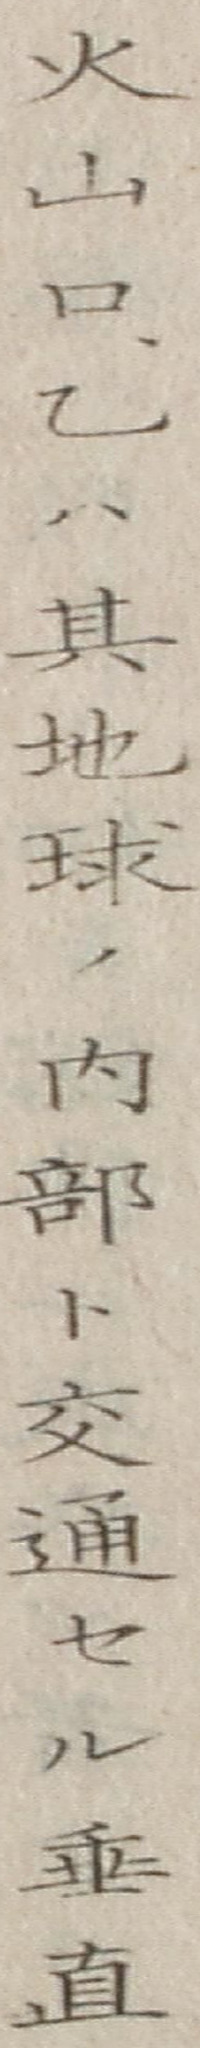火山口、乙ハ其地球ノ内部ト交通セル垂直
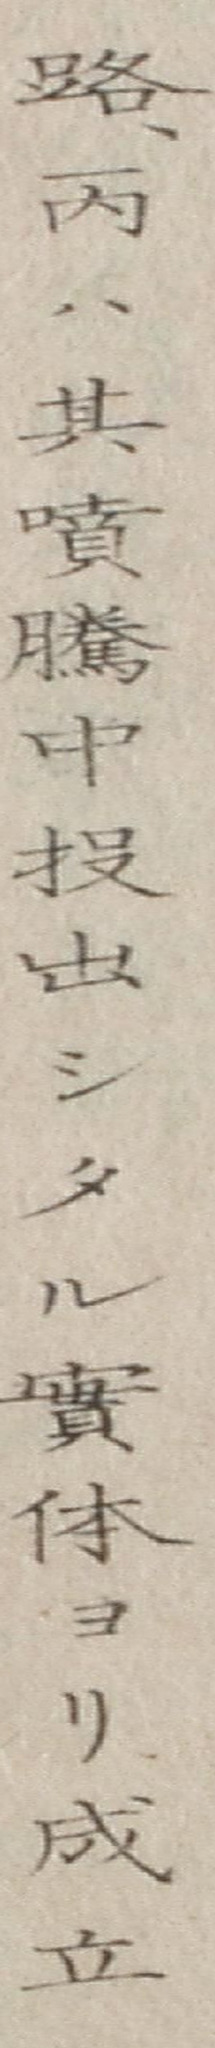路、丙ハ其噴騰中投出シタル実体ヨリ成立
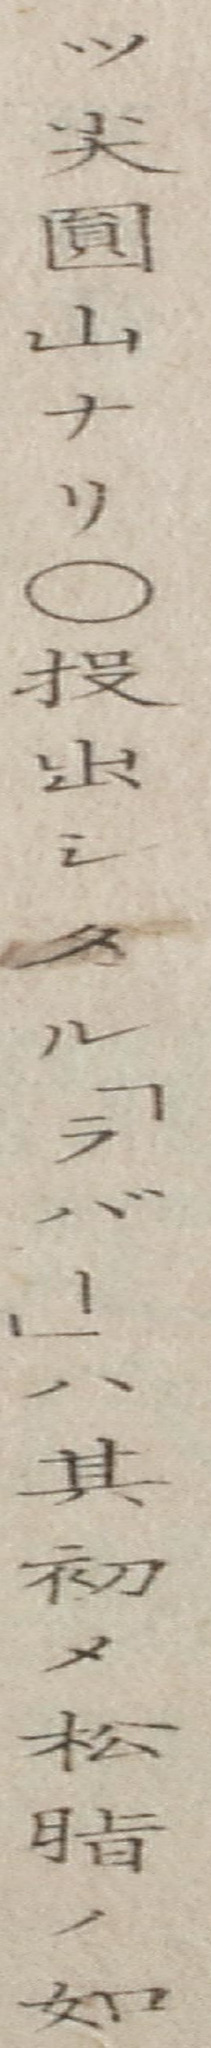ツ尖円山ナリ○投出シタル「ラバー」ハ其初メ松脂ノ如
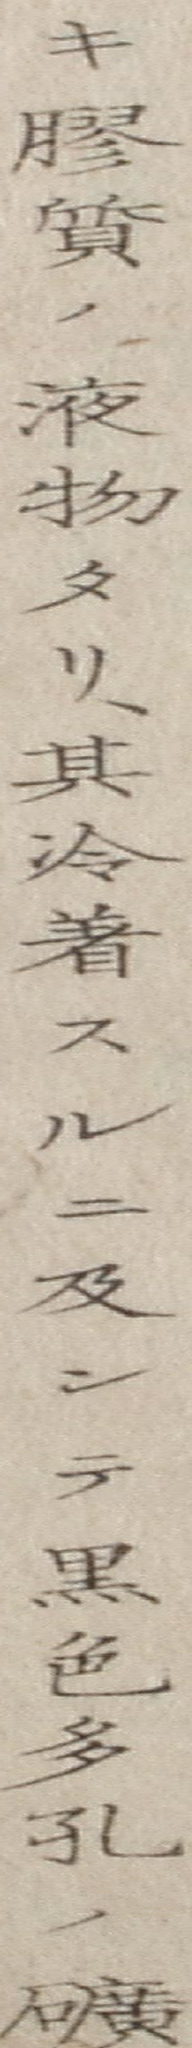キ膠質ノ液物タリ、其冷着スルニ及ンテ黒色多孔ノ礦
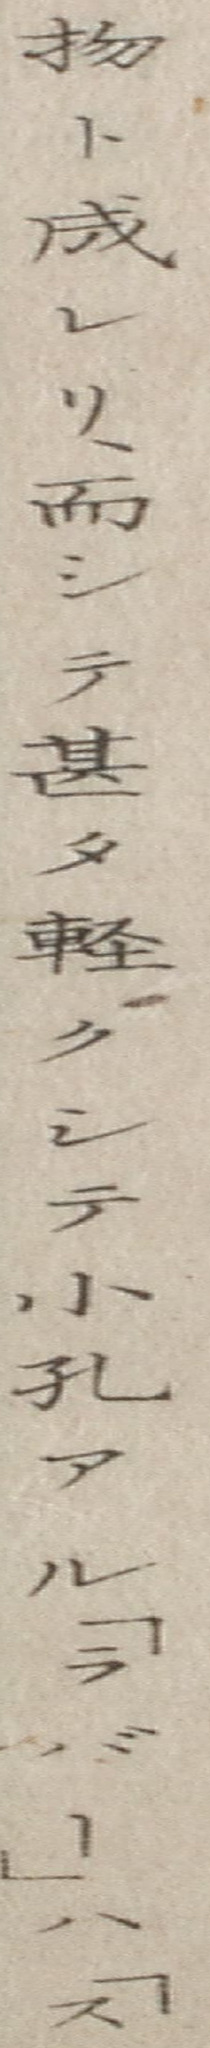物ト成レり、而シテ甚タ軽クシテ小孔アル「ラバー」ハ「ス
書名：地形論　巻二
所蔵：東京大学地震研究所図書室 Earthquake Research Institute Library, The University of Tokyo, JAPAN
